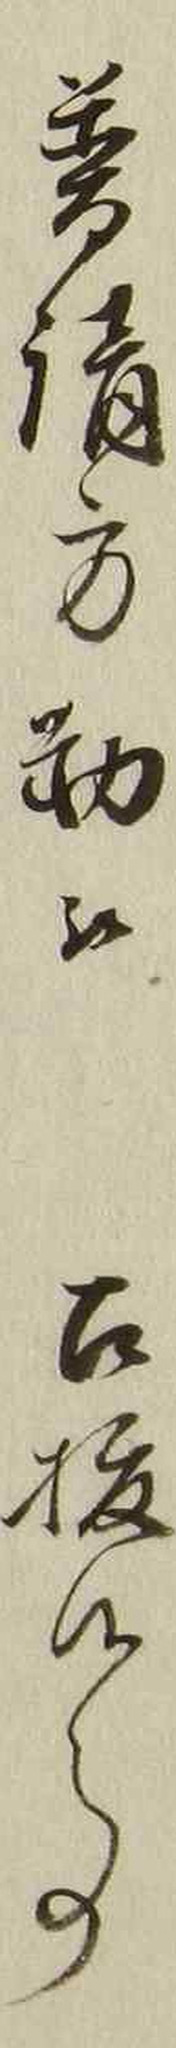普請方勤被召抜候事
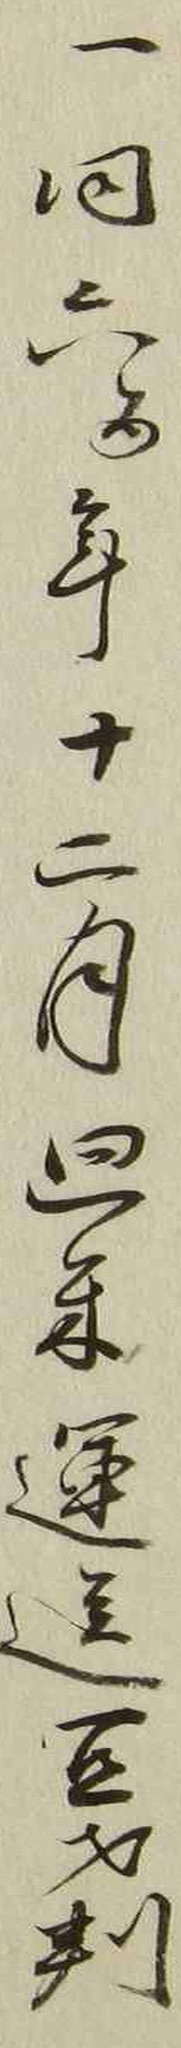一同六酉年十二月廻米運送宜才判
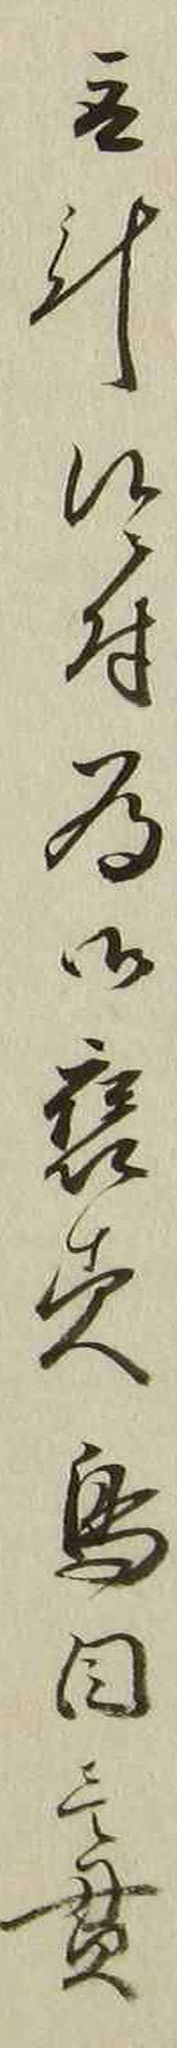取計候ニ付為御褒美鳥目壱貫
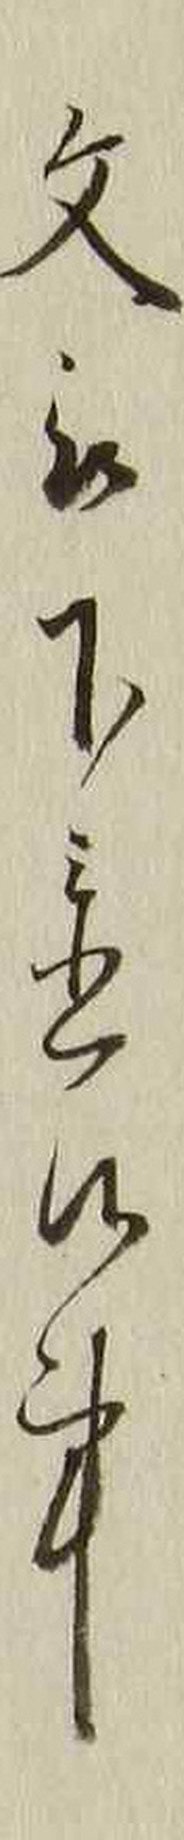文被下置候事
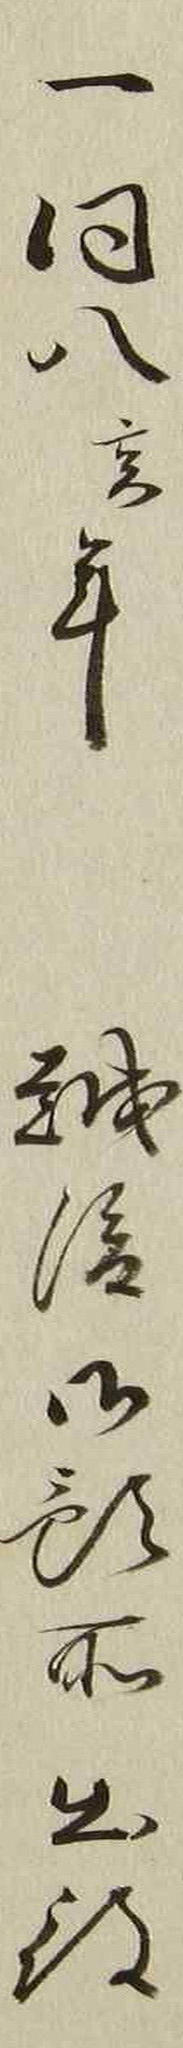一同八亥年越後御預所出役
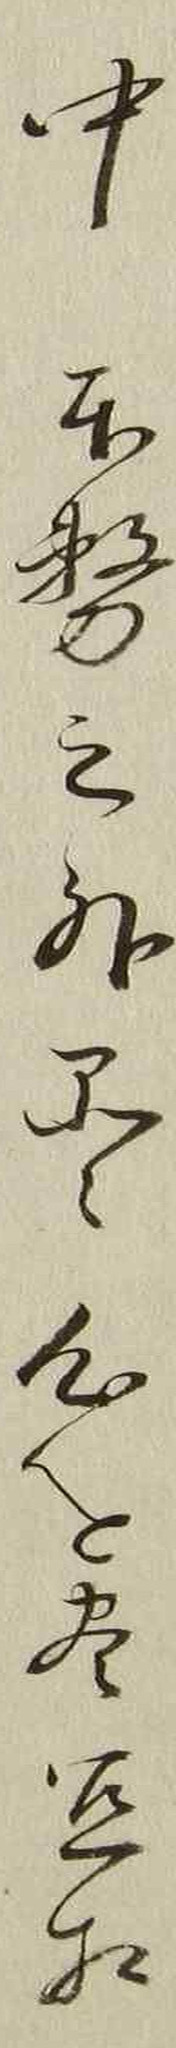中本務之外品々心を尽宜相
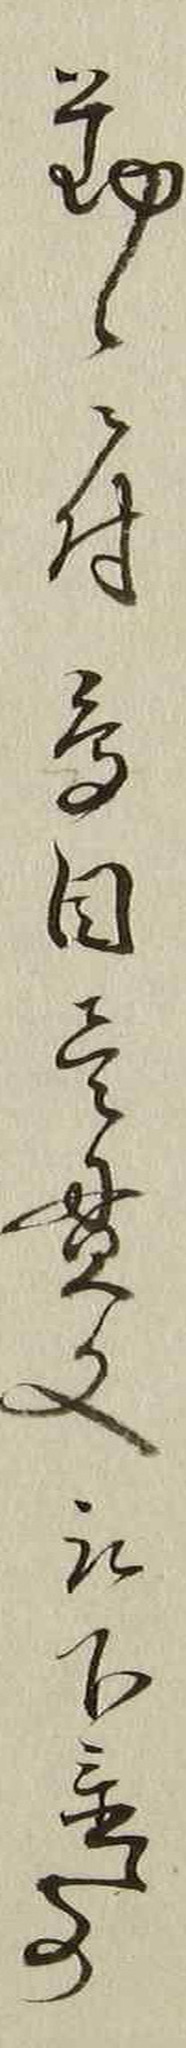勤候ニ付鳥目壱貫文被下置候事
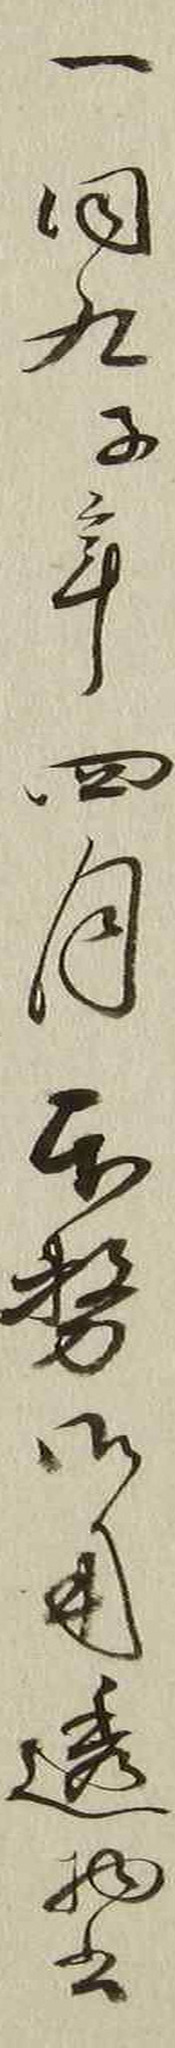一同九子年四月本務御用透物書
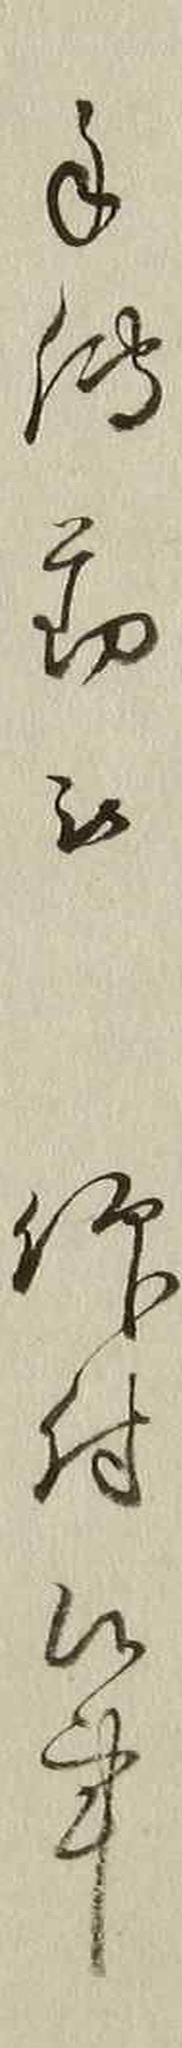手伝勤被仰付候事
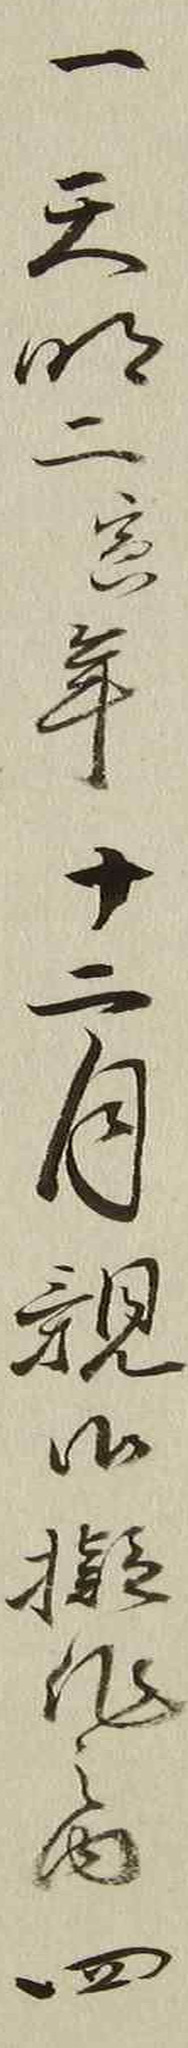一天明二寅年十二月親御擬作之内四
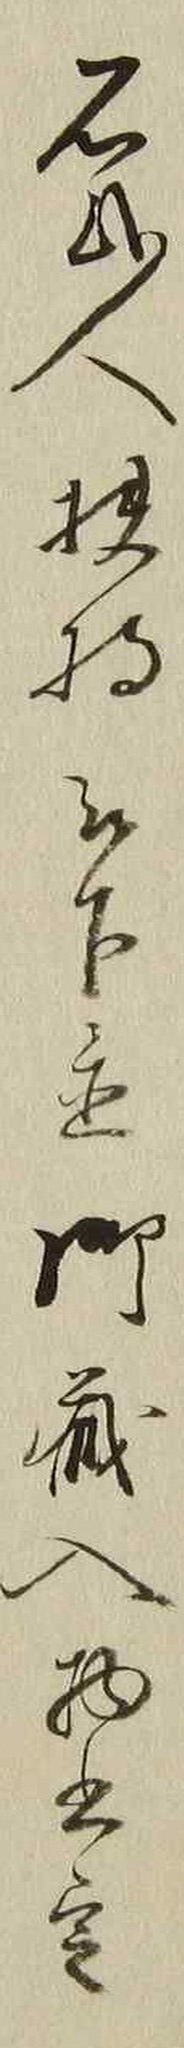石弐人扶持被下置御蔵入物書定
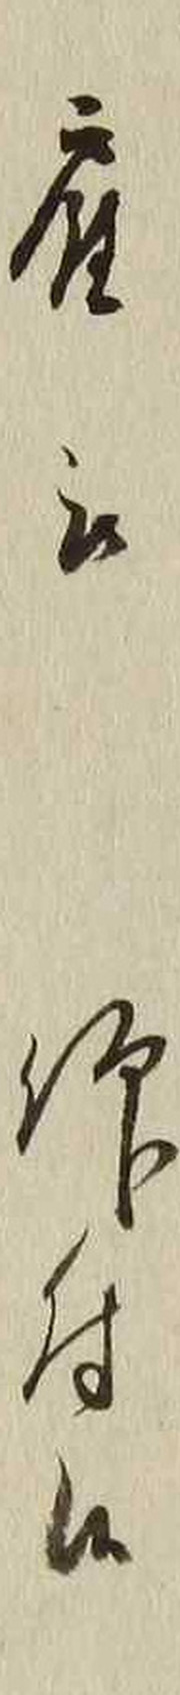雇被仰付候
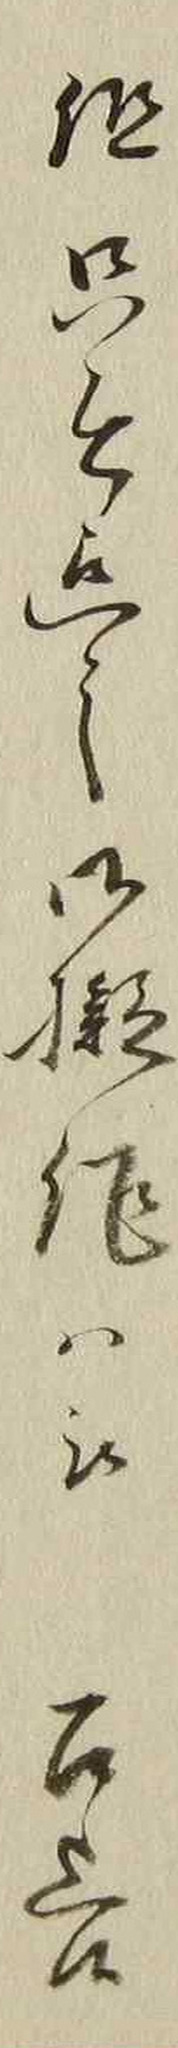但只今迄之御擬作ハ被召上候
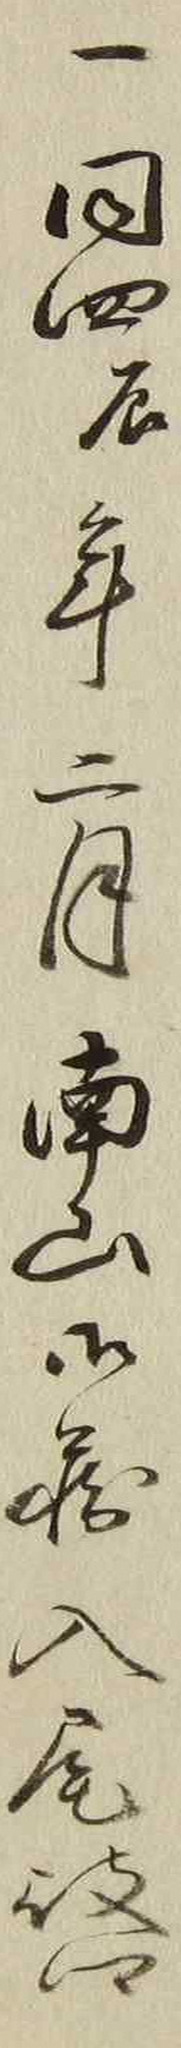一同四辰年二月南山御蔵入尾岐郷
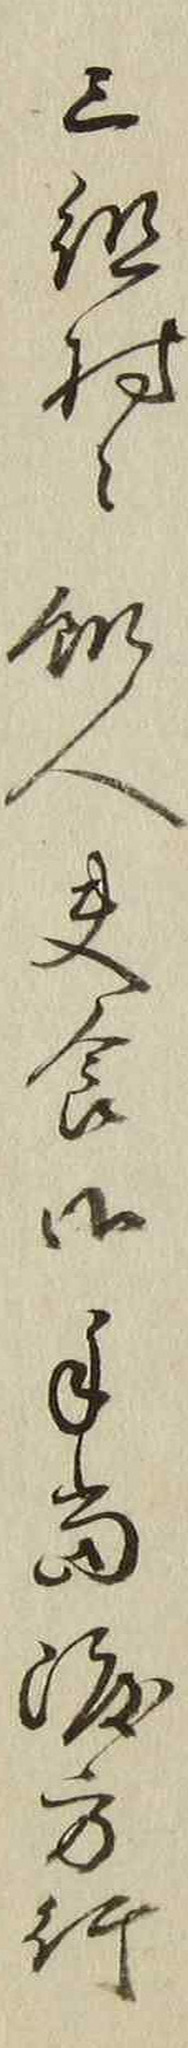三組村々飢人夫食御手当渡方行
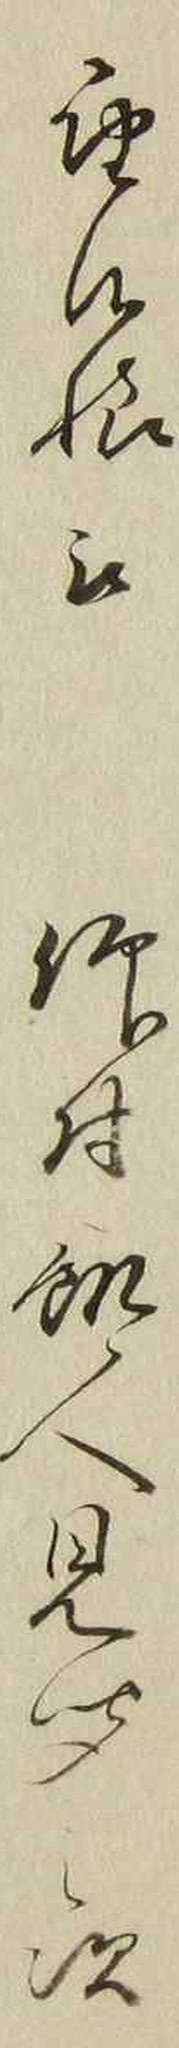届候様被仰付飢人見聞之次
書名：諸士系譜　巻之52　に之部3
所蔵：会津若松市立会津図書館
